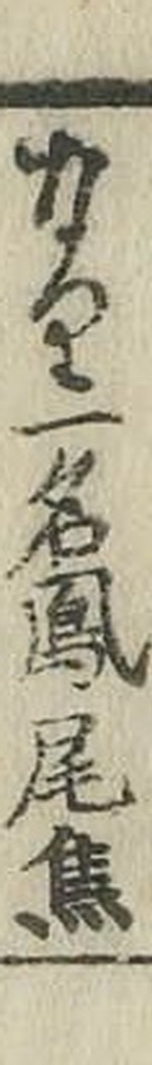なり一名鳳尾焦
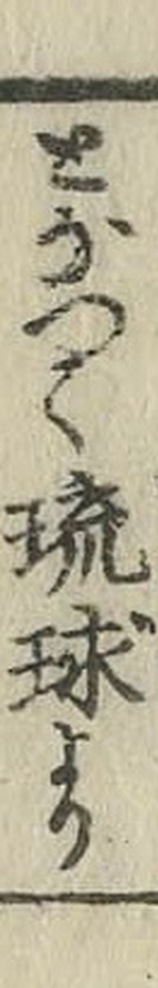となつく琉球より
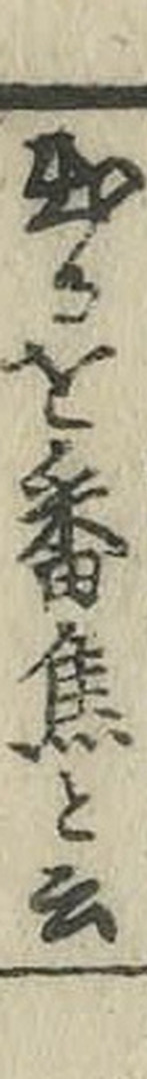出るを番焦と云

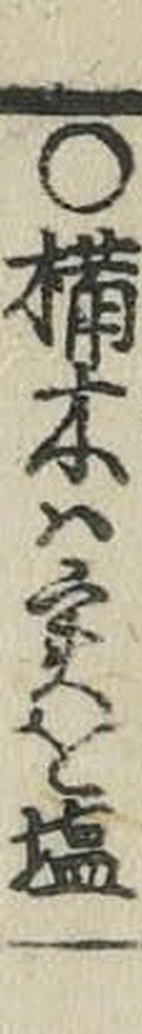○備木は実を塩
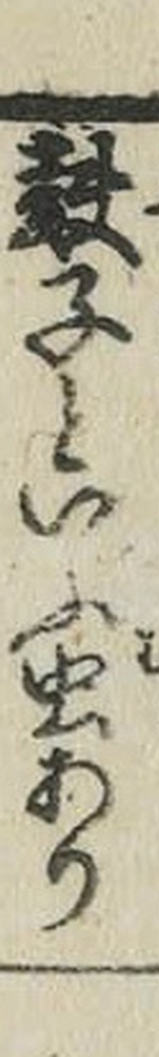麩子といふ虫あり
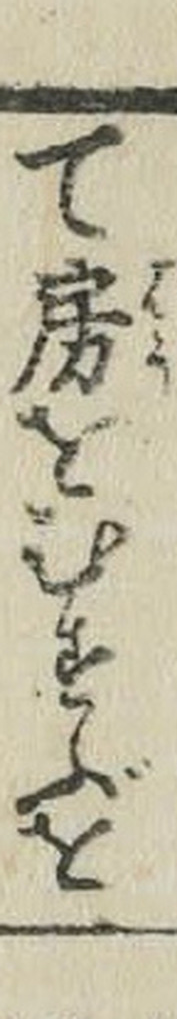て房をむすぶを
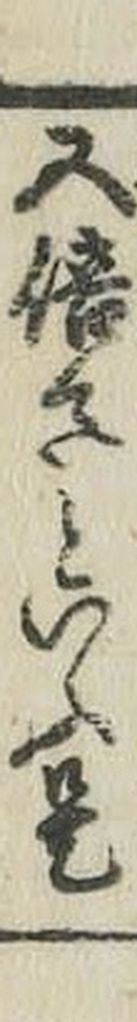五倍子といふ是
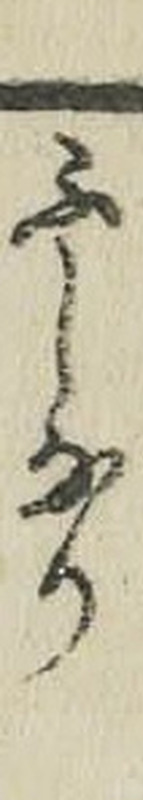ふしなり
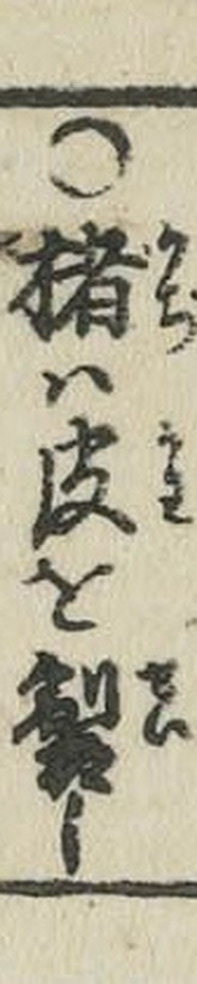○楮は皮を製し
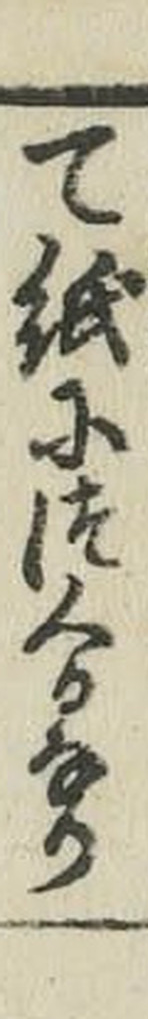て紙につくるなり
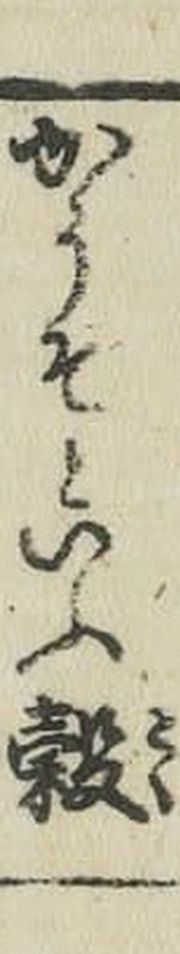かうそといふ穀
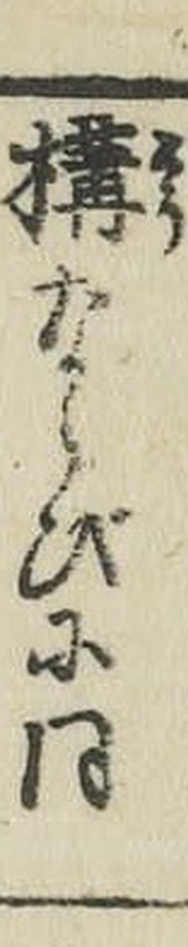構ならびに同
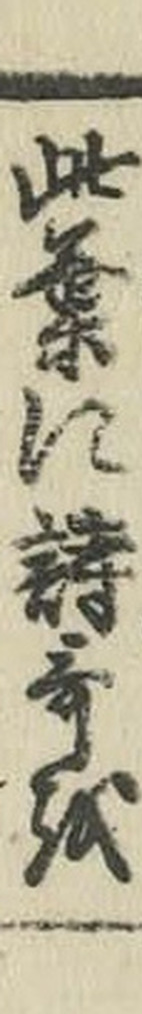此葉に詩歌を
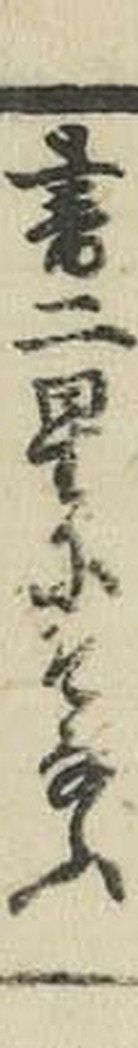書二星にそなふ
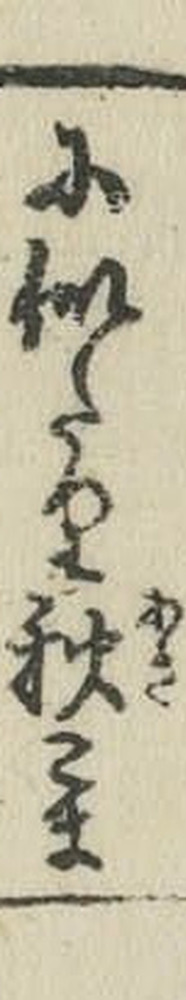に似たり秋こま
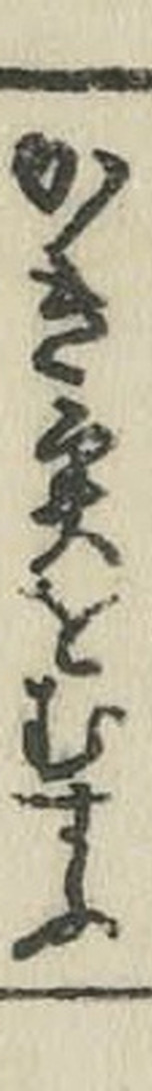かき実をむすふ
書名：増補頭書訓蒙図彙大成 10巻 8:巻之17-19
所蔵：東京学芸大学教育コンテンツアーカイブ
